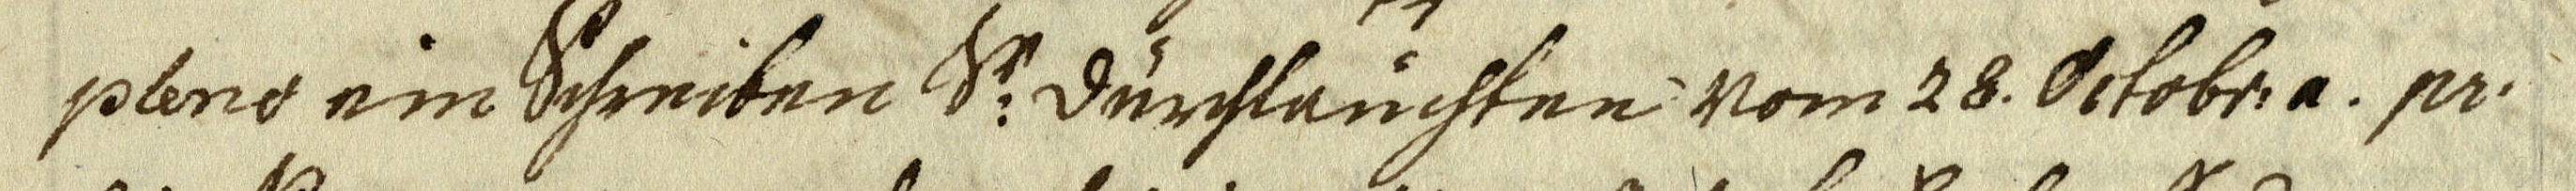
pleno ein Schreiben Sr. Durchlauchten vom 28. Octobr. a. pr.
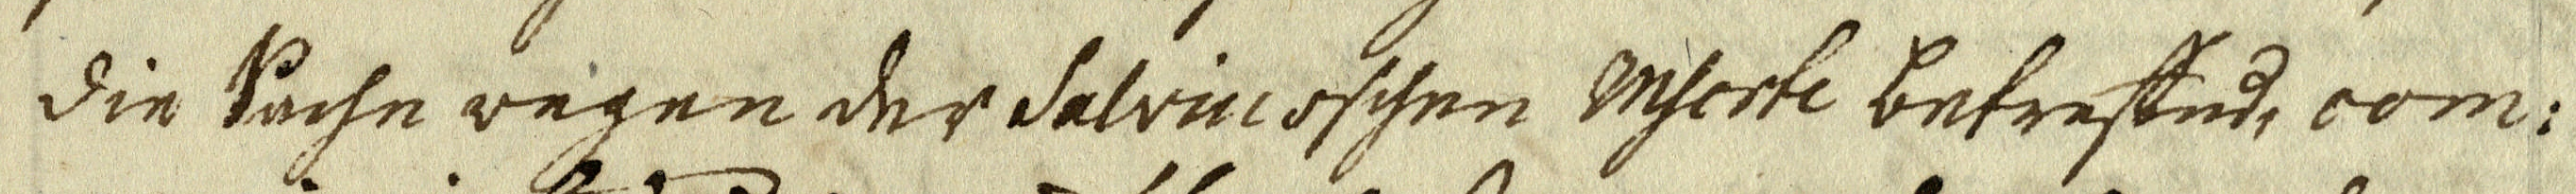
die Sache wegen der Salviusschen Mscrte betreffend com¬
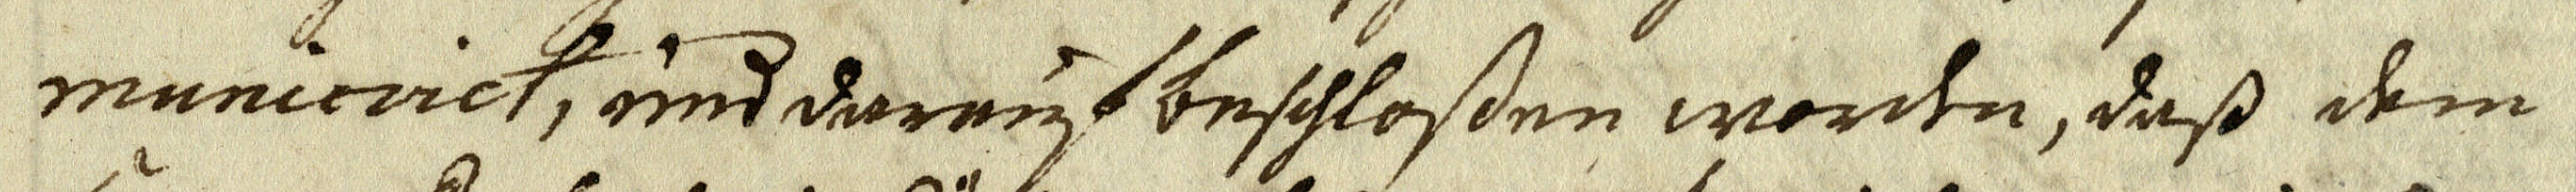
municiret, und darauf beschloßen worden, daß dem
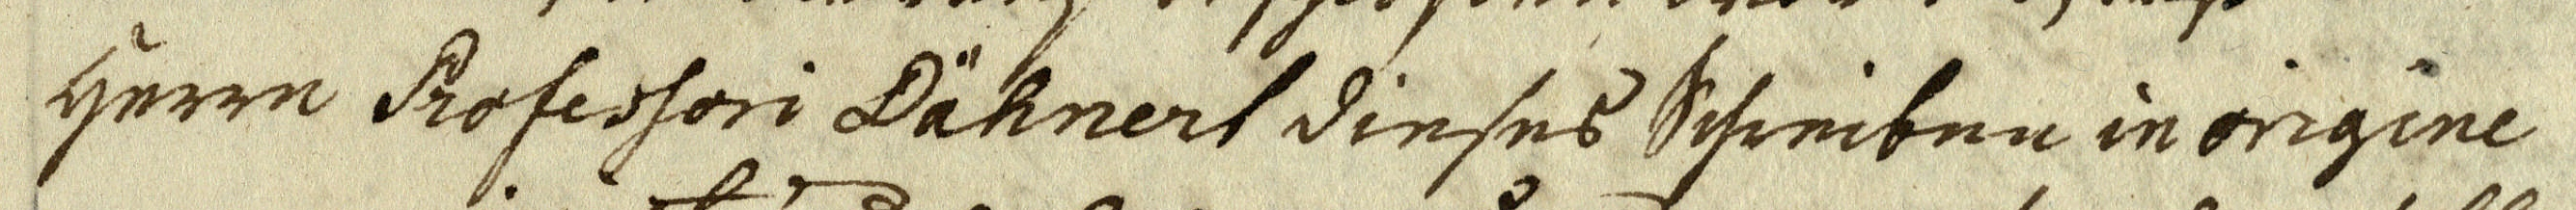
Herrn Professori Dähnert dieses Schreiben in origine
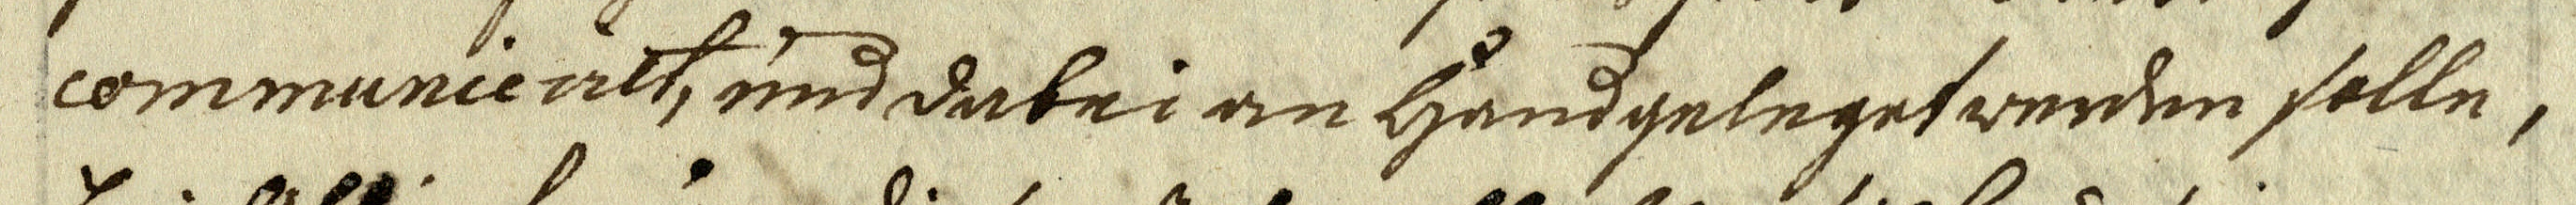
communiciret, und dabei an Hand geleget werden solte,
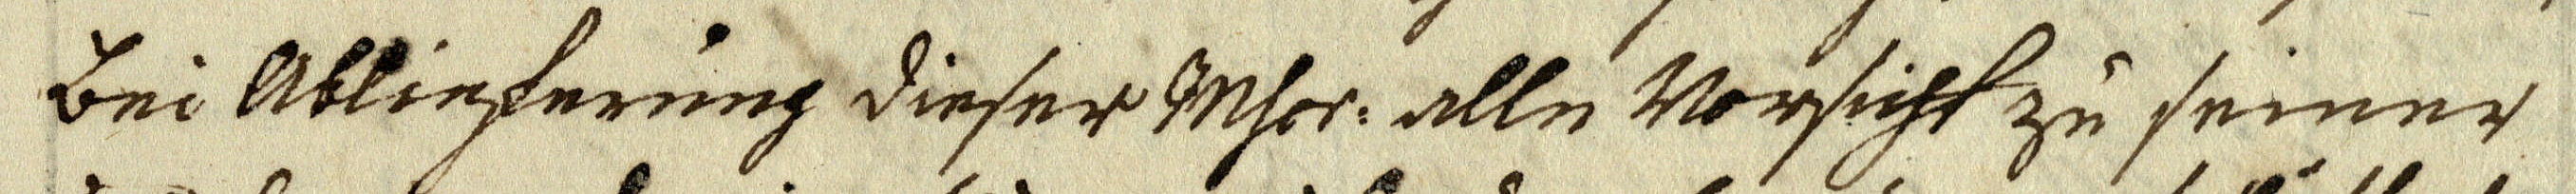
bei Ablieferung dieser Mscr. alle Vorsicht zu seiner
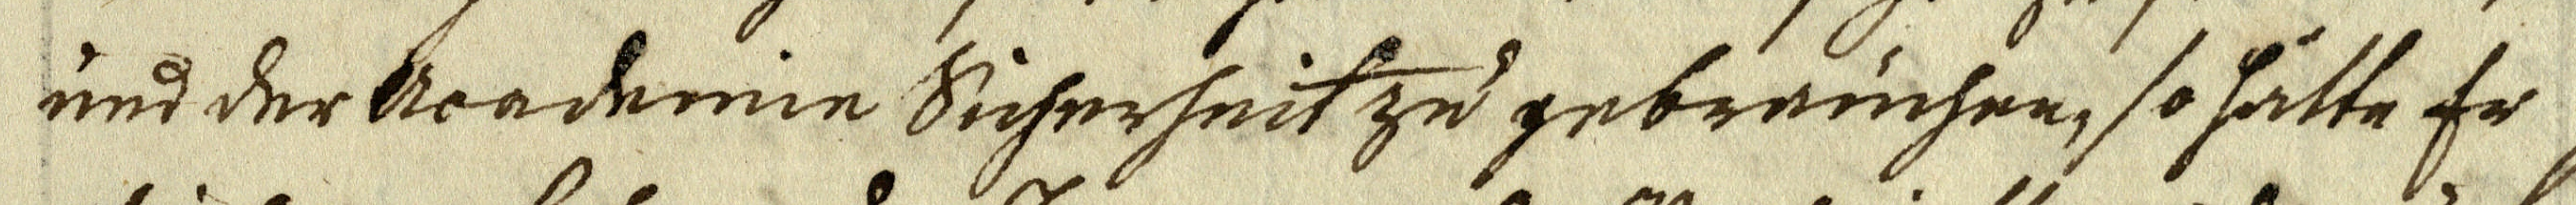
und der AcademieSicherheit zu gebrauchen, so hätte Er
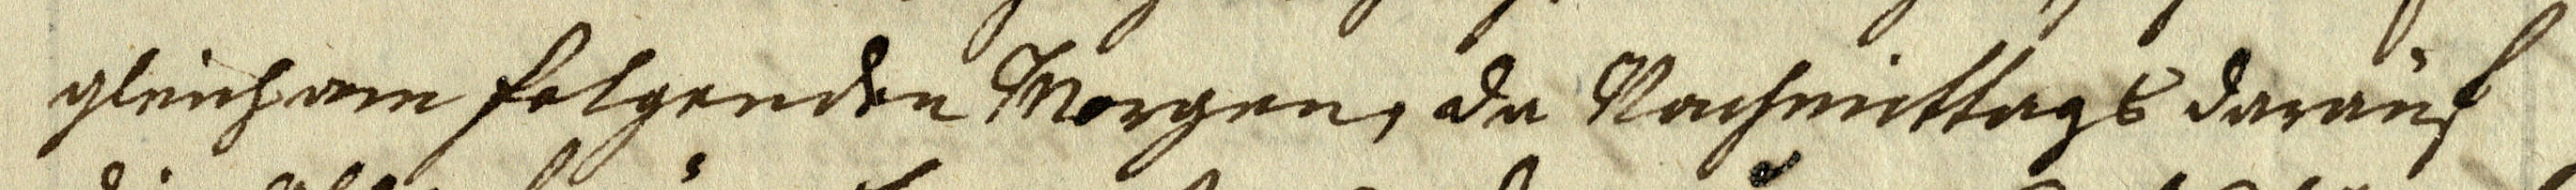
gleich am folgenden Morgen, da Nachmittags darauf
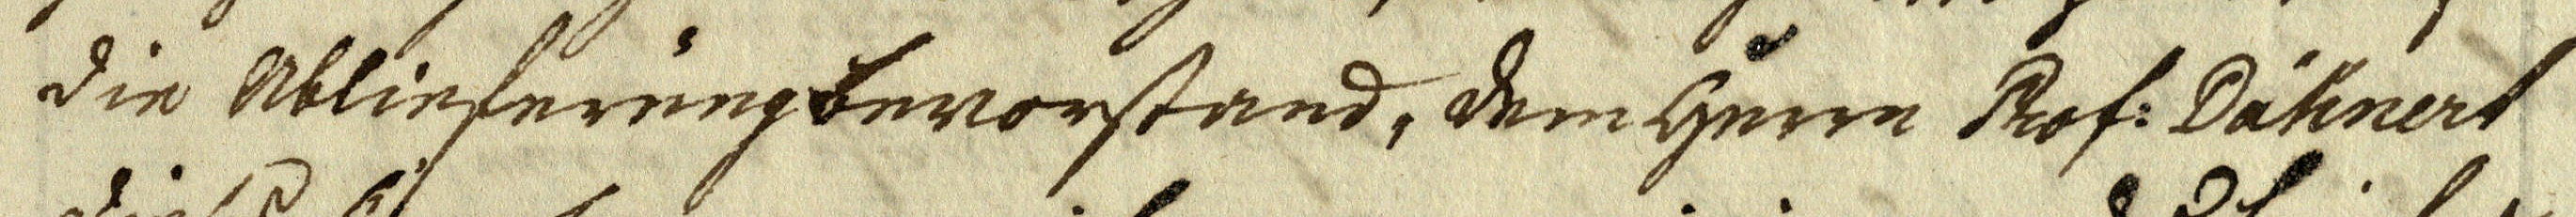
die Ablieferung bevorstand, dem Herrn Prof. Dähnert
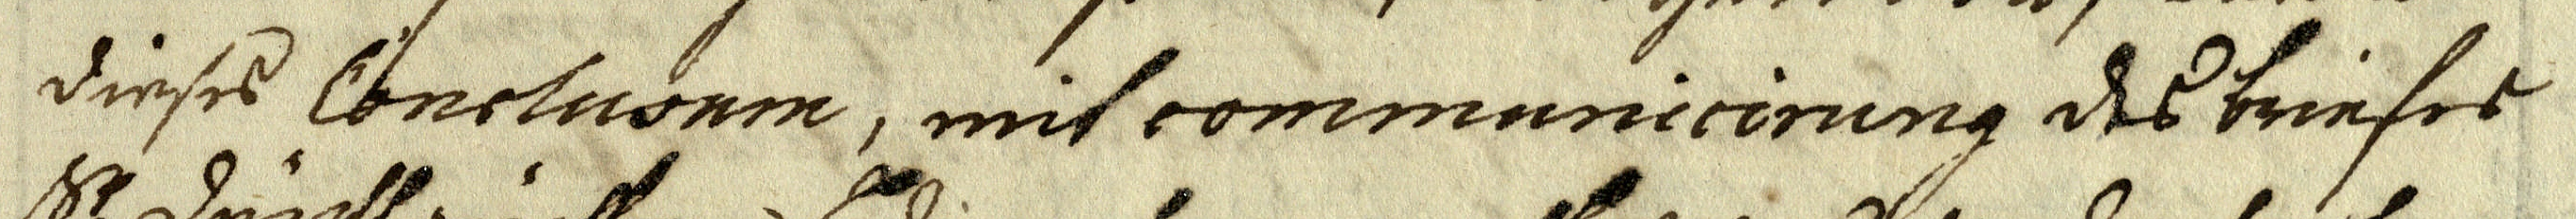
dieses Conclusum, mit communicirung des Briefes
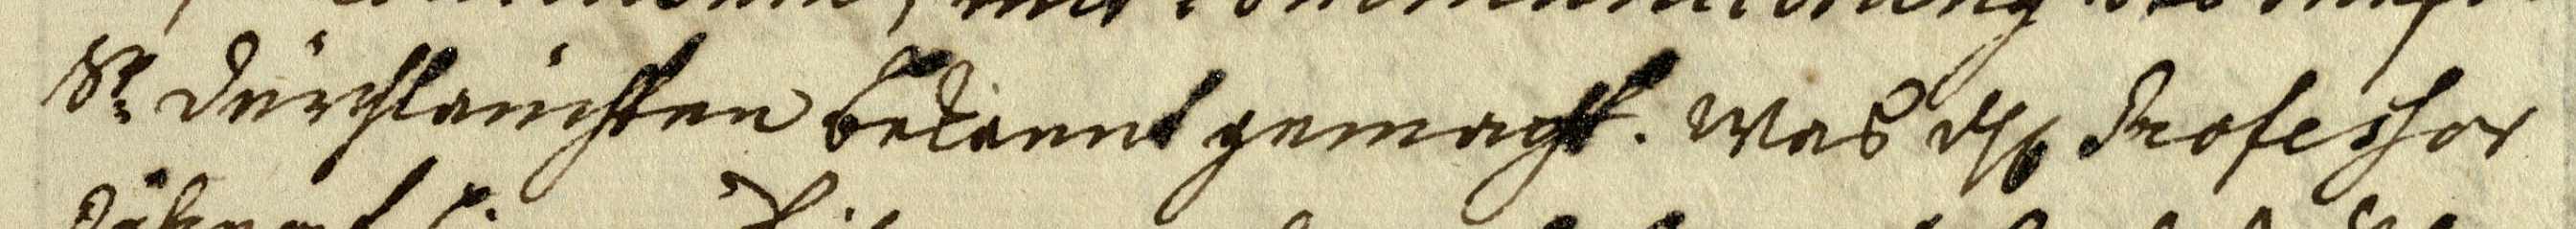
Sr. Durchlauchten bekannt gemacht. Was dh Professor
